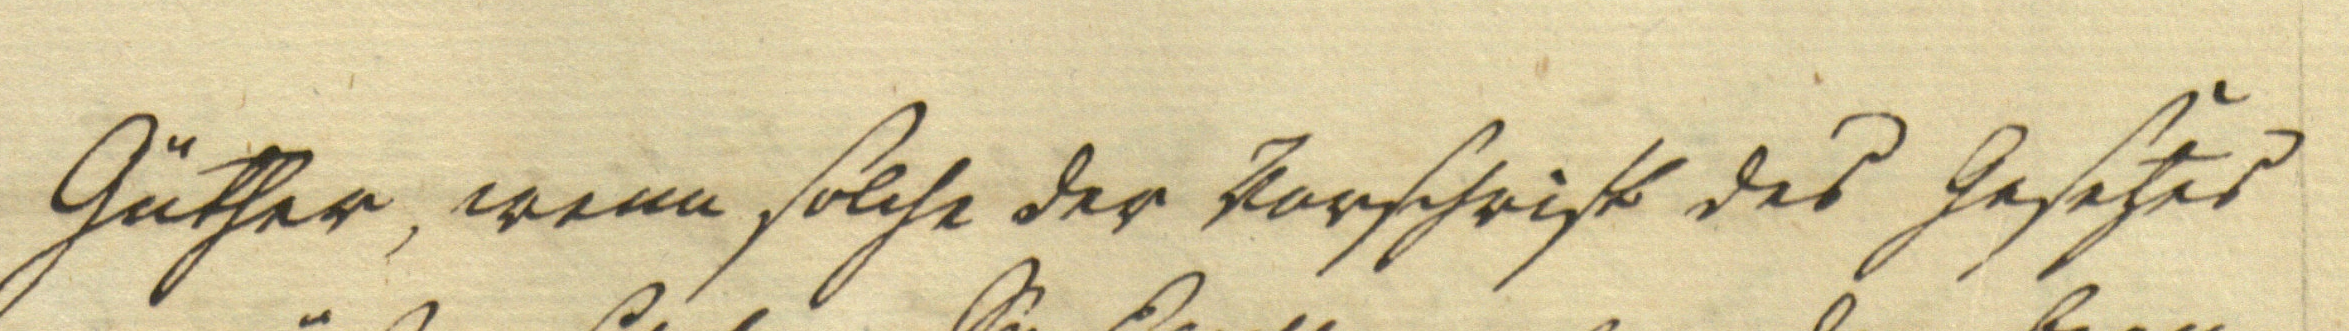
Güther, wenn solche der Vorschrift des Gesetzes
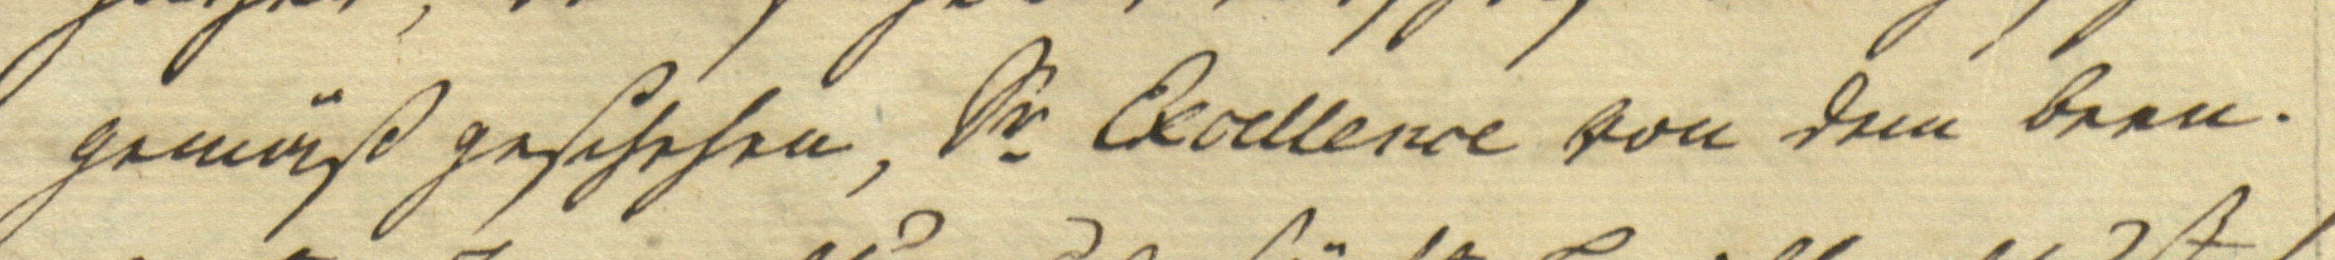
gemäß geschehen, Sr Excellence von dem been¬
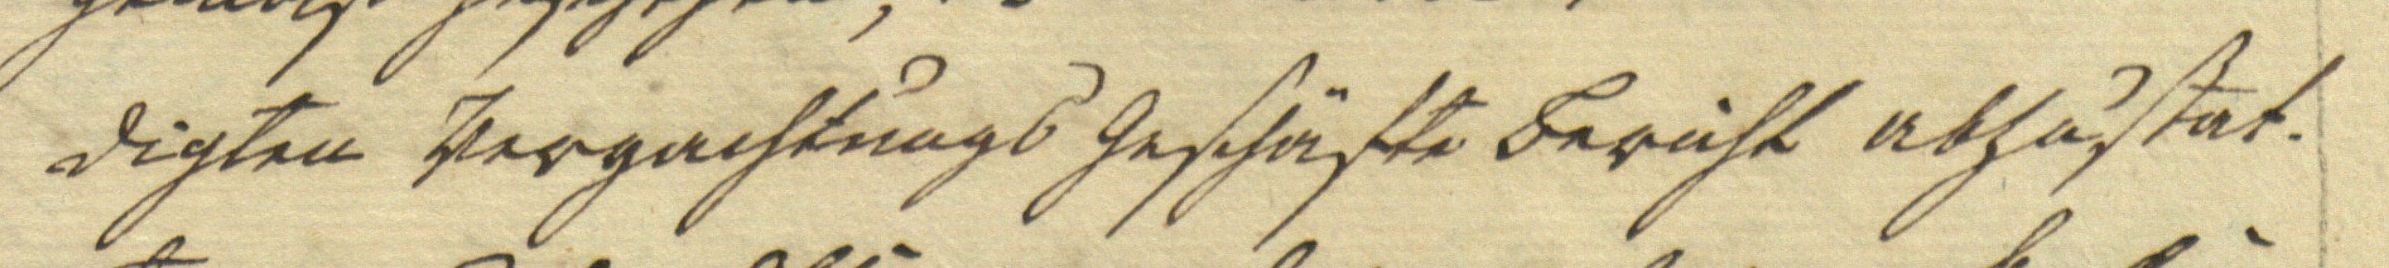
digten Verpachtungs Geschäfte Bericht abzustat¬
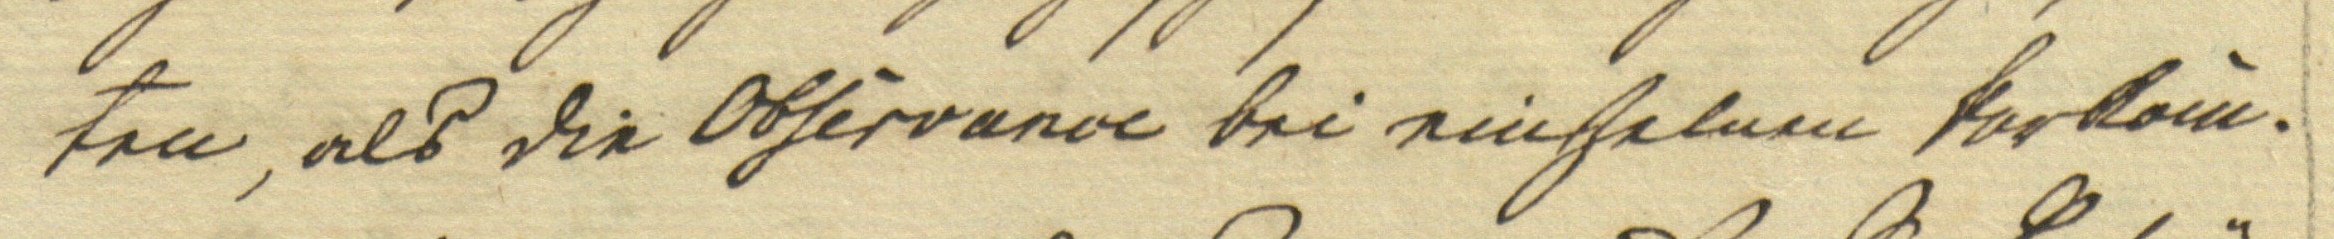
ten, als die Observance bei einzelnen Vorkom¬
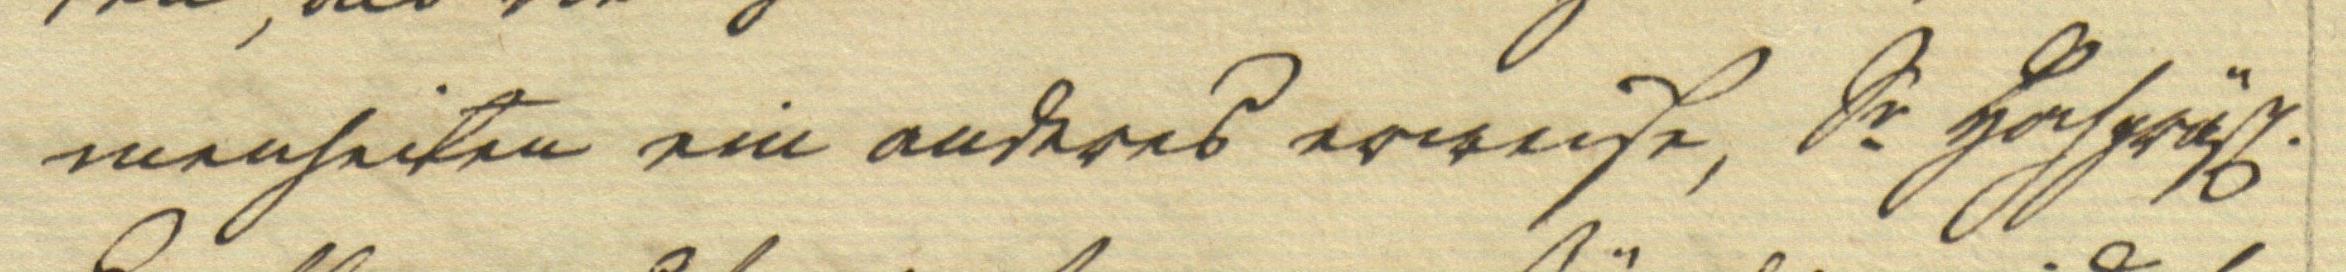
menheiten ein anderes erweise, Sr Hochgräfl.
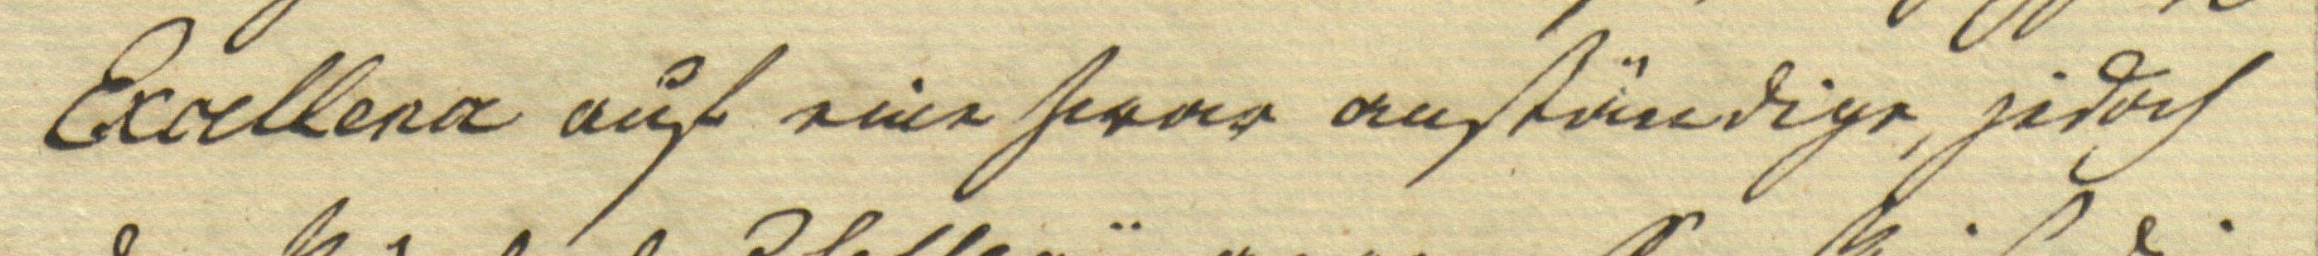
Excellence auf eine zwar anständige, jedoch
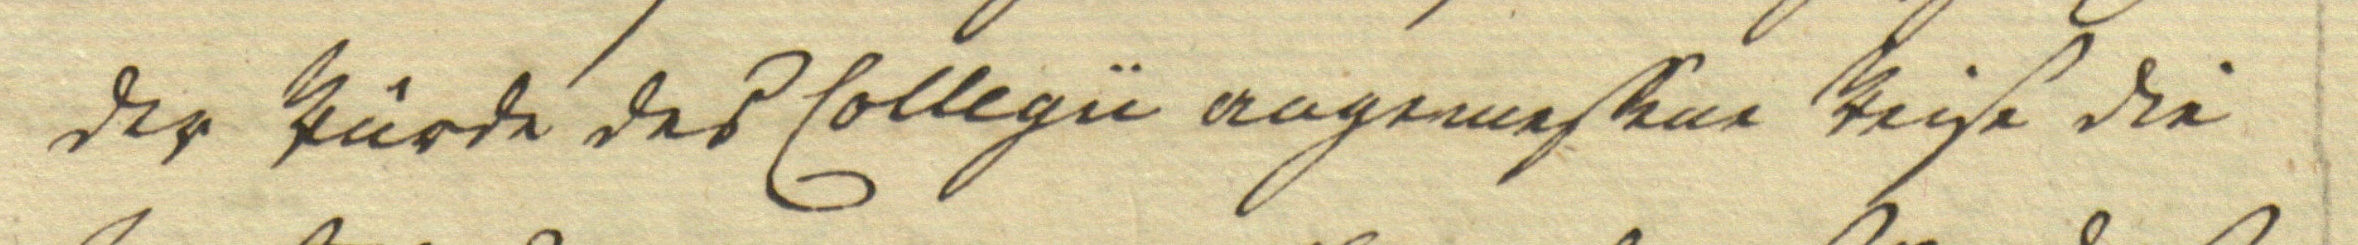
der Würde des Collegii angemessene Weise die
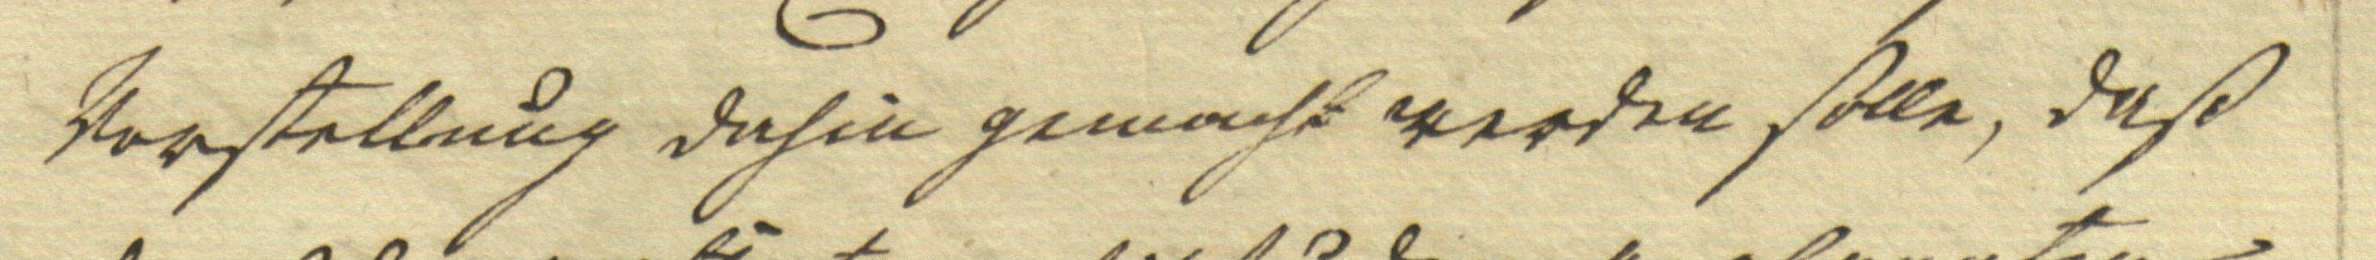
Vorstellung dahin gemacht werden solle, daß
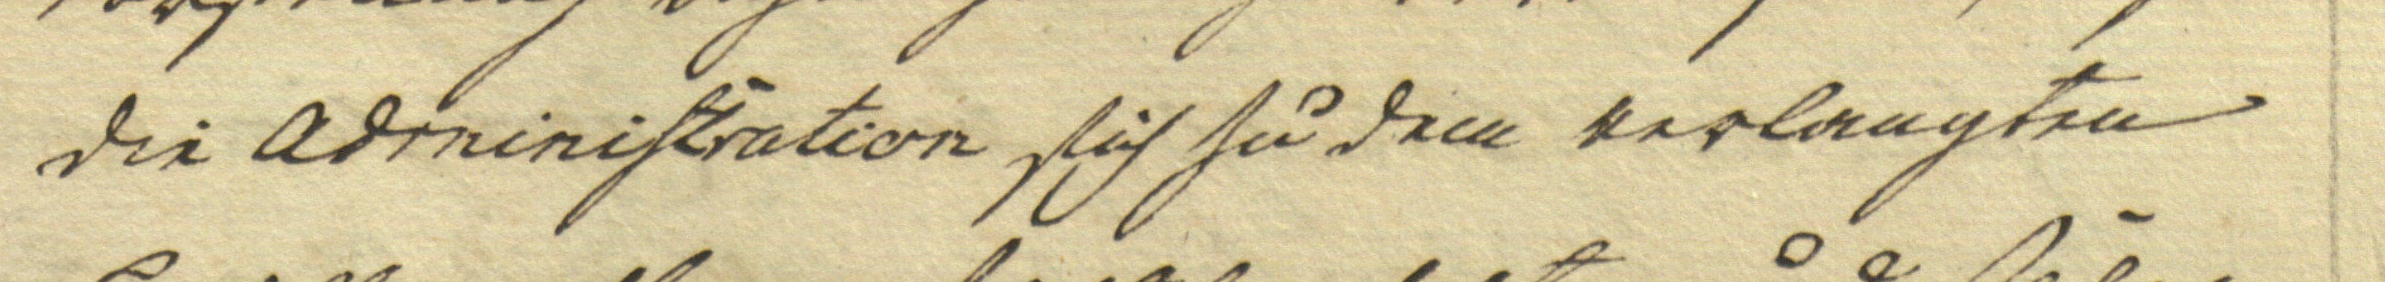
die Administration sich zu dem verlangten
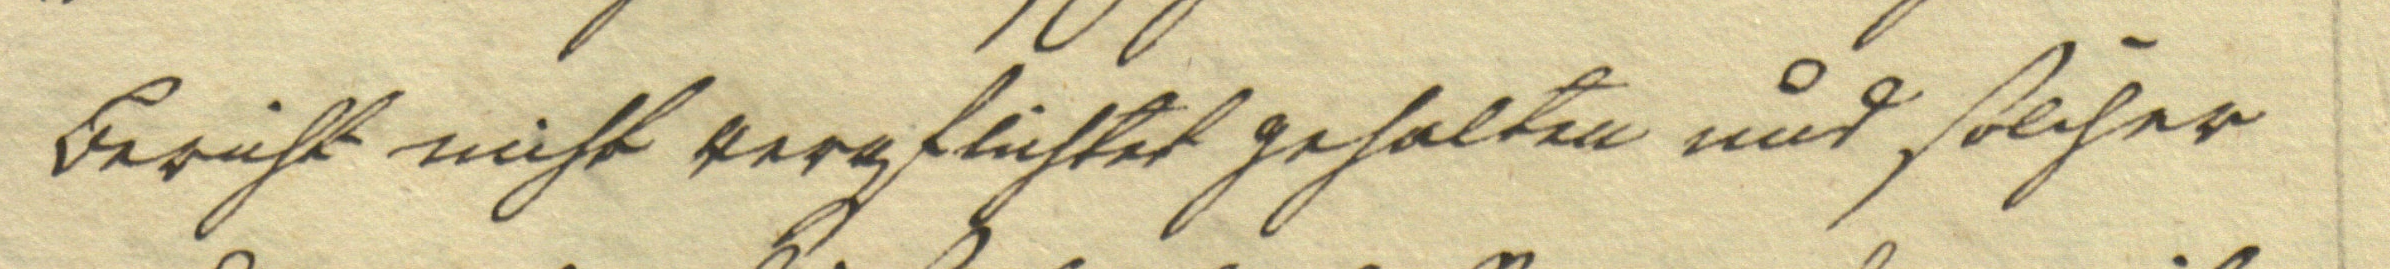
Bericht nicht verpflichtet gehalten und solcher
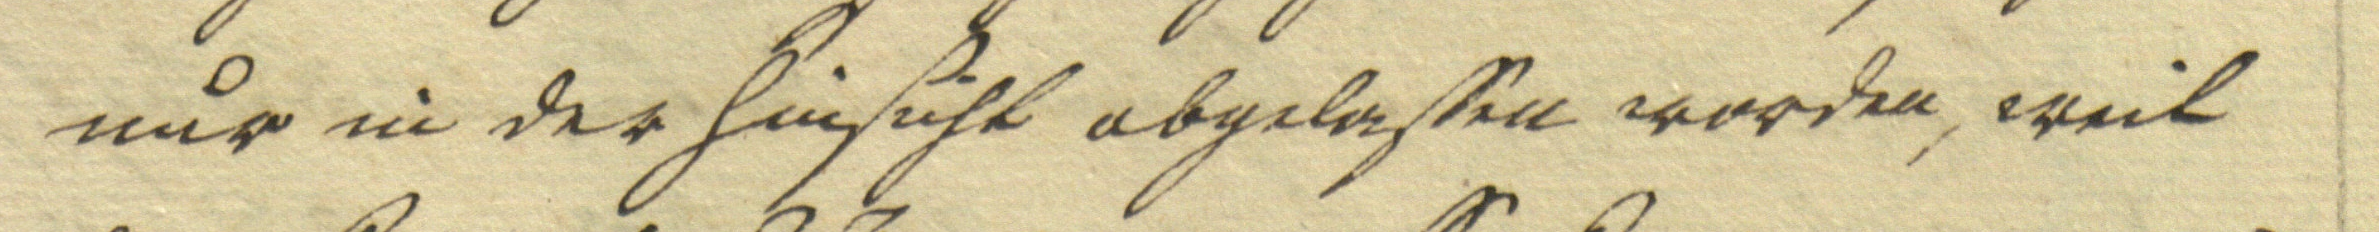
nur in der Hinsicht abgelassen worden, weil
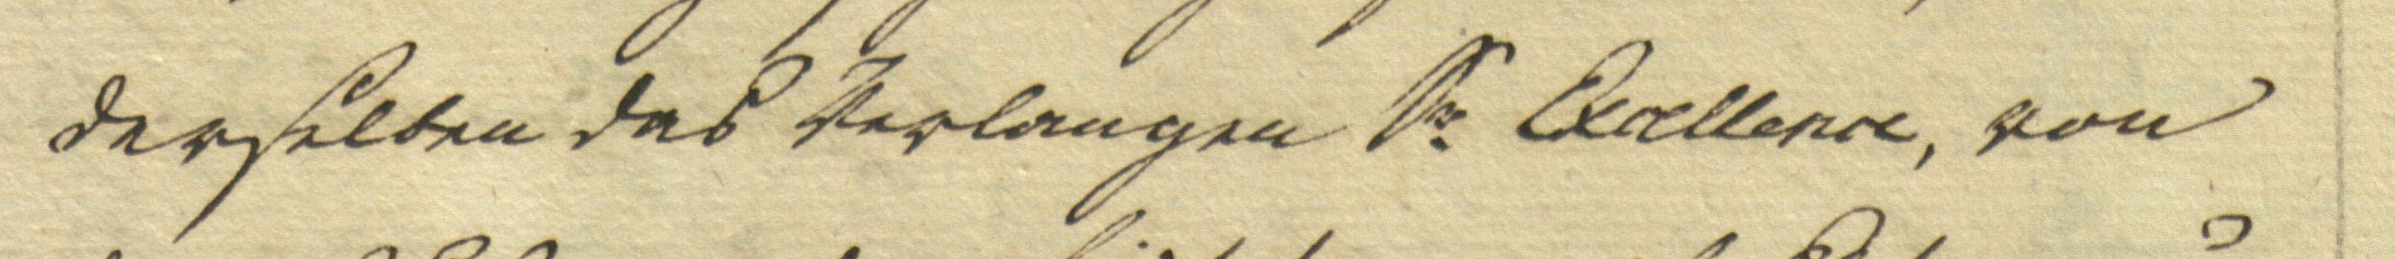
derselben das Verlangen Sr Excellence, von
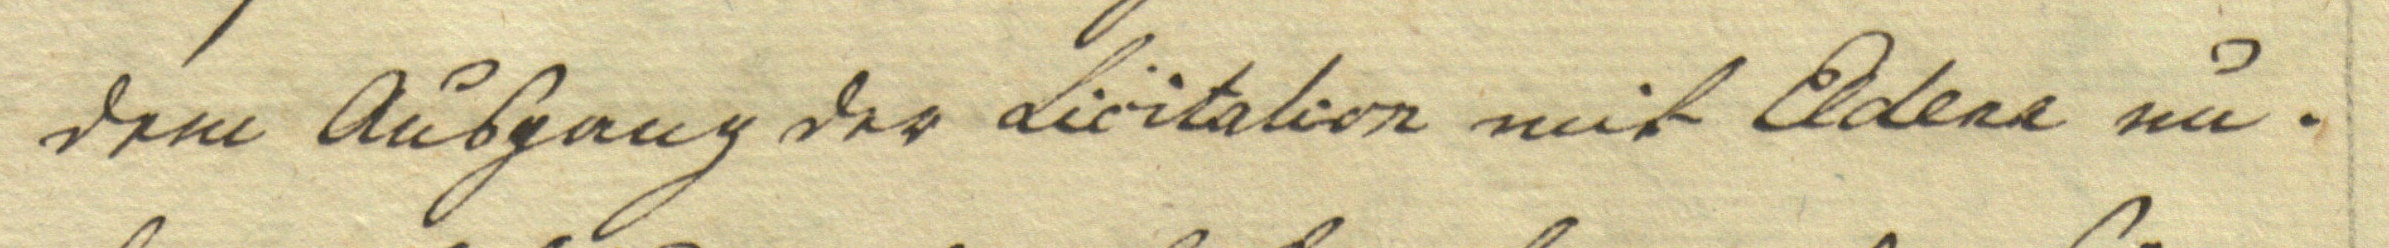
dem Ausgang der Licitation mit Eldena un¬
